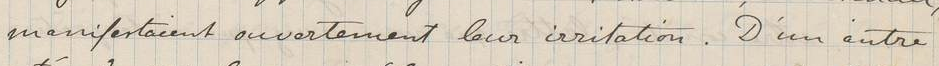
manifestaient ouvertement leur irritation. D'un autre
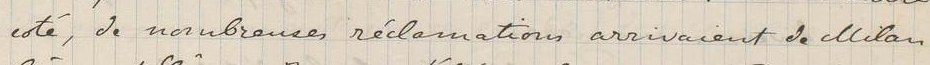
coté, de nombreuses réclamations arrivaient de Milan
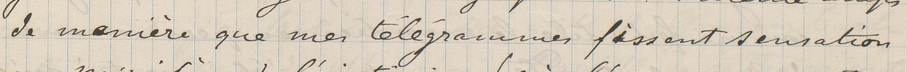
de manière que mes télégrammes fissent sensation
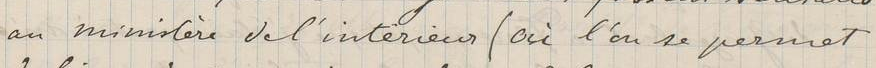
au ministère de l'intérieur (où l'on se permet
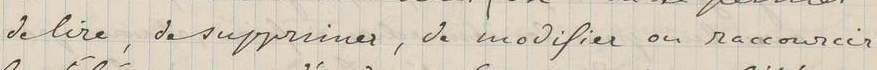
de lire, de supprimer, de modifier ou raccourcir
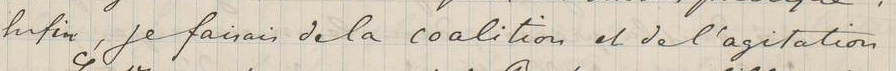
Enfin, je faisais de la coalition et de l'agitation.
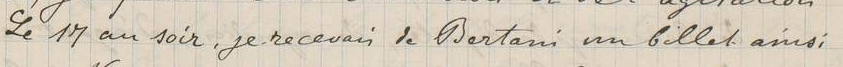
Le 17 au soir, je recevais de Bertani un billet ainsi
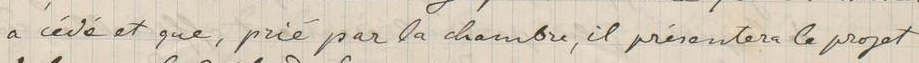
a cédé et que, prié par la chambre, il présentera le projet
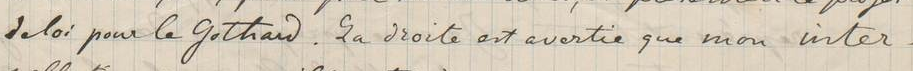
de loi pour le Gothard. La droite est avertie que mon inter-
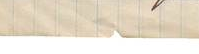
conciliante.».
